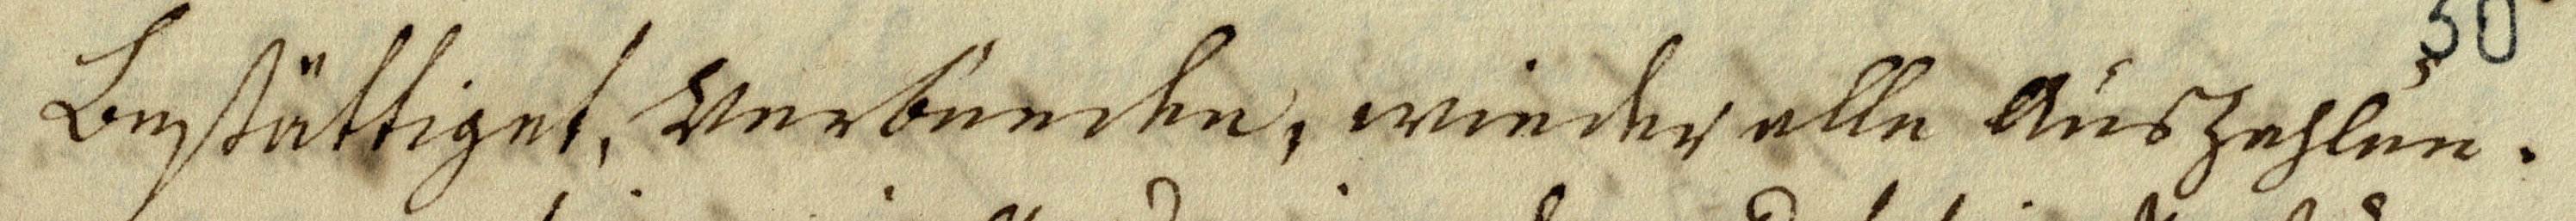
bestättiget, verbunden wieder alle Auszahlun¬
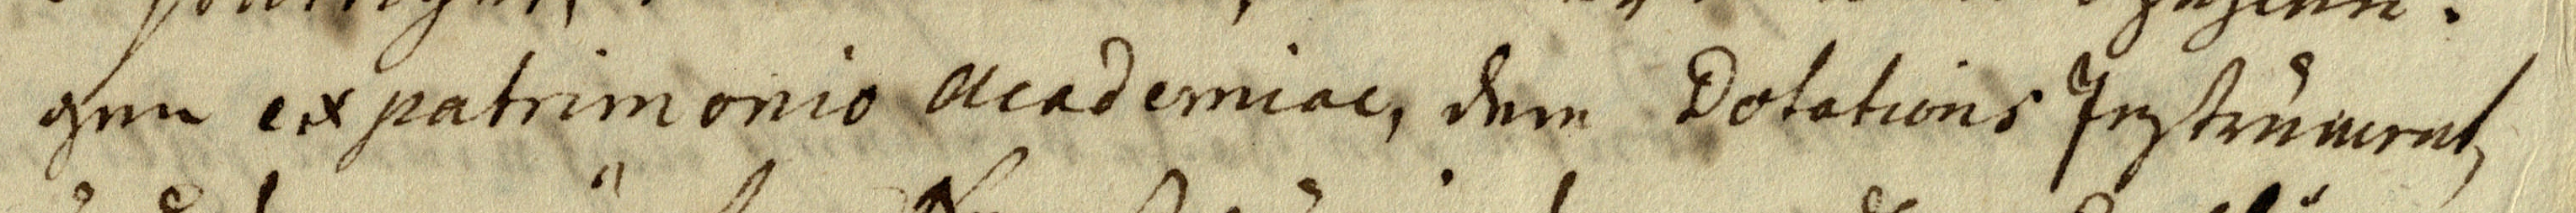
gen ex patrimonio Academiae, dem Dotations Instrument,
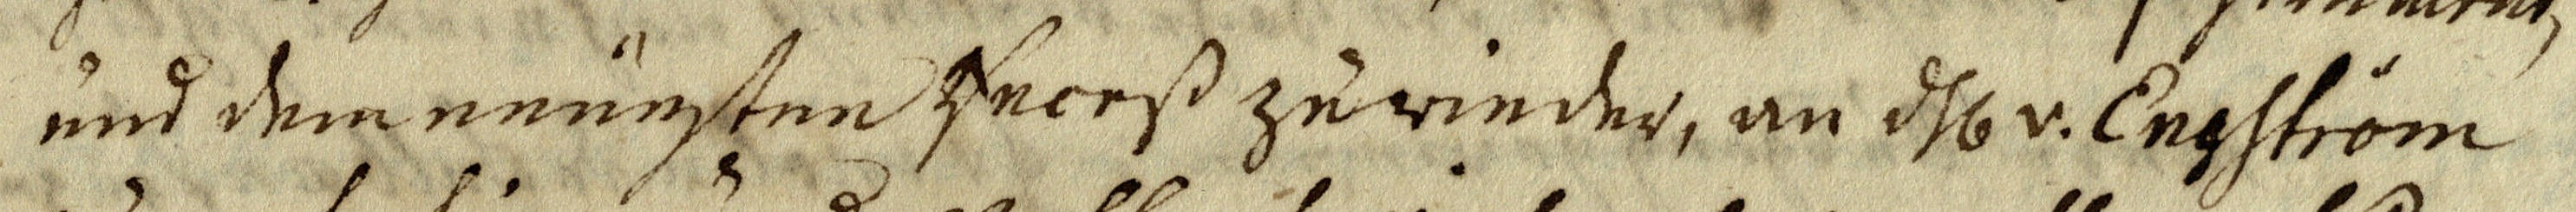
und dem neuesten Receß zuwieder, an dh v. Engström
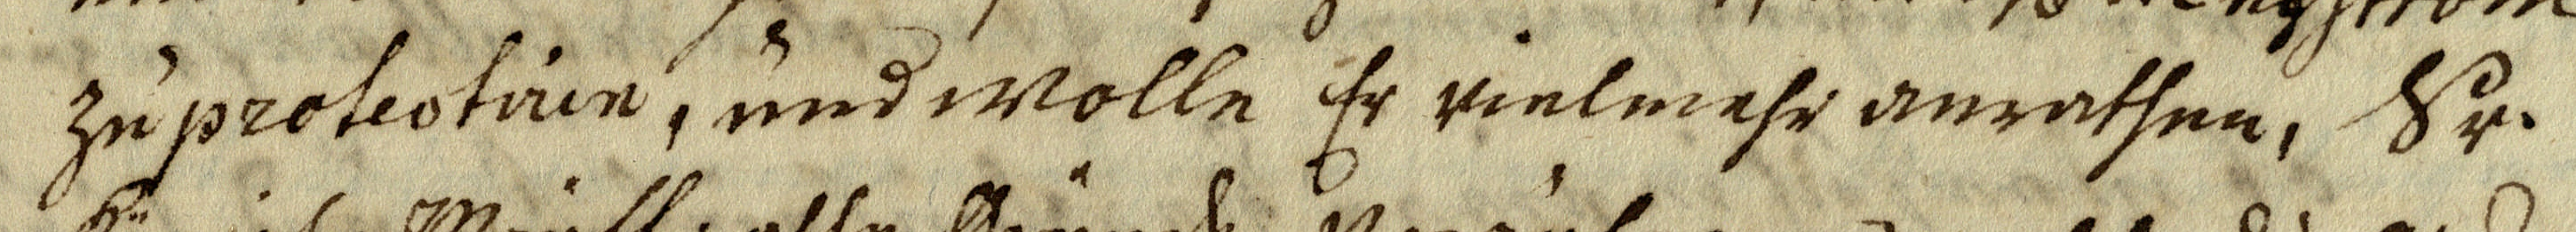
zu protestiren, und wolle Er vielmehr anrathen, Sr.
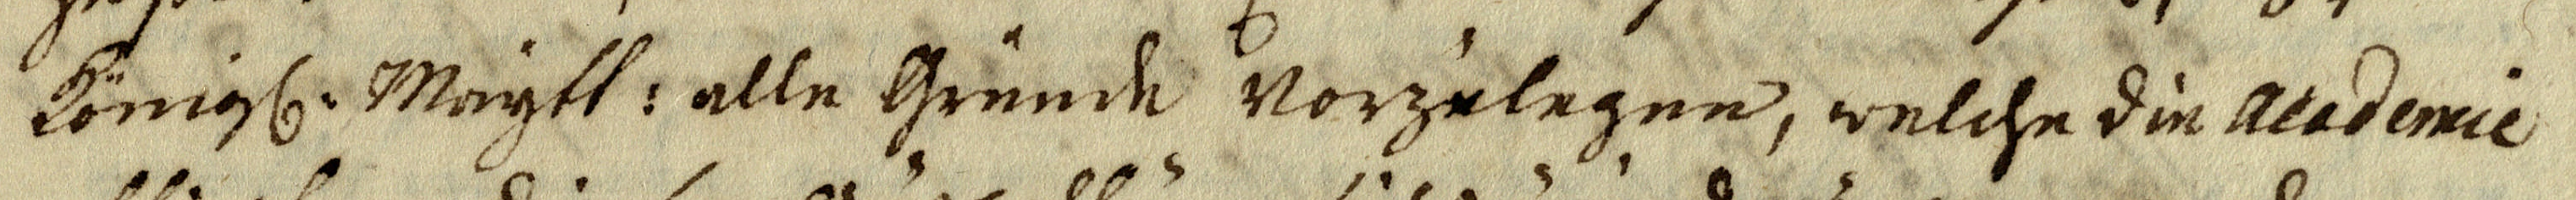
Königl. Maÿtt. alle Gründe vorzulegen, welche die Academie
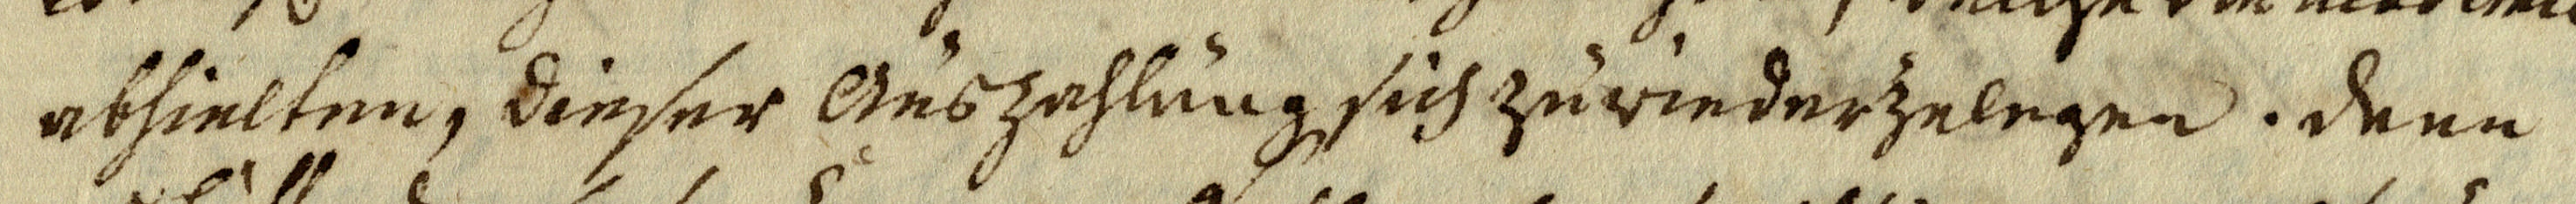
abhielten, dieser Auszahlung sich zuwiederzulegen. Denn
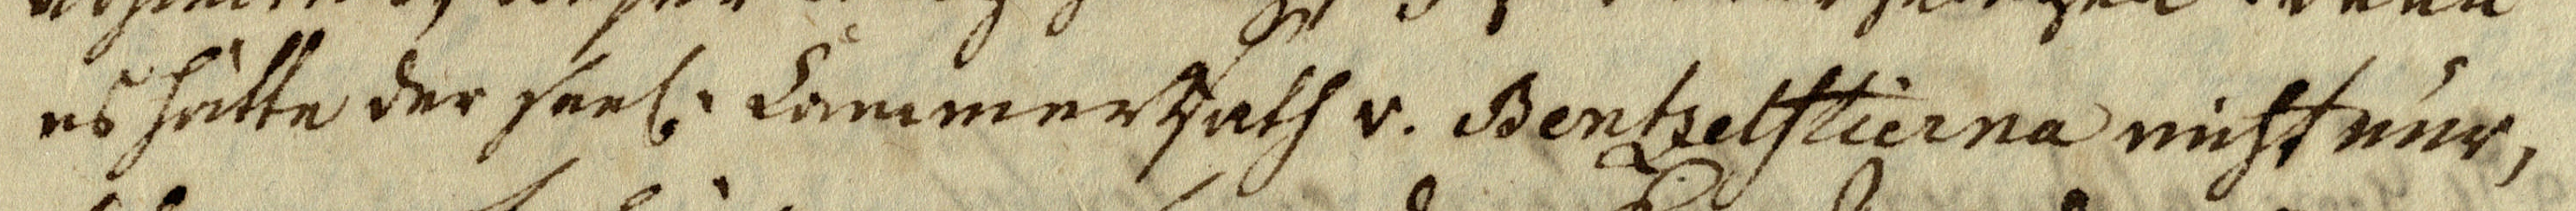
es hätte der seel. CammerRath v. Bentzelstierna nicht nur,
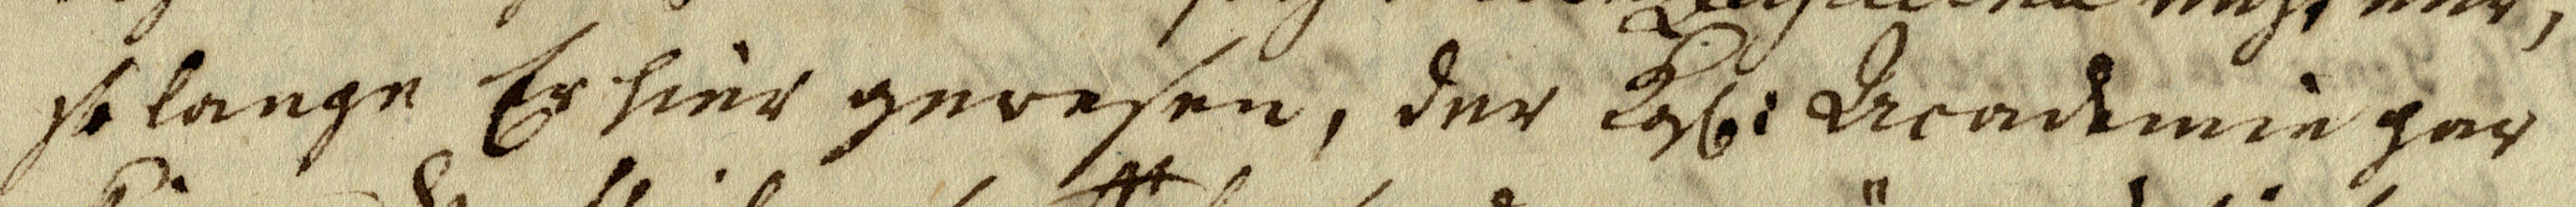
so lange Er hier gewesen, der Kgl. Academie gar
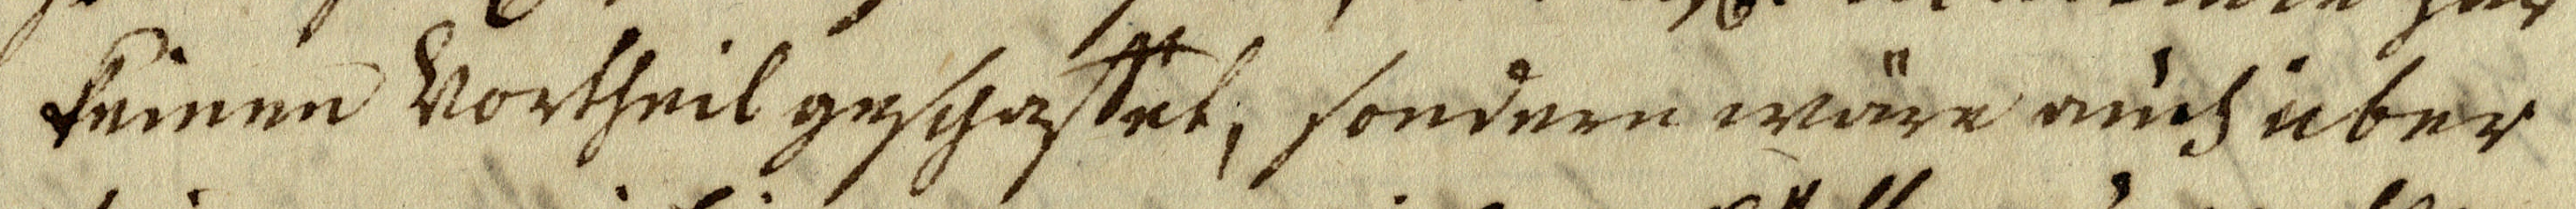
keinen Vortheil geschaffet, sonder wäre auch über
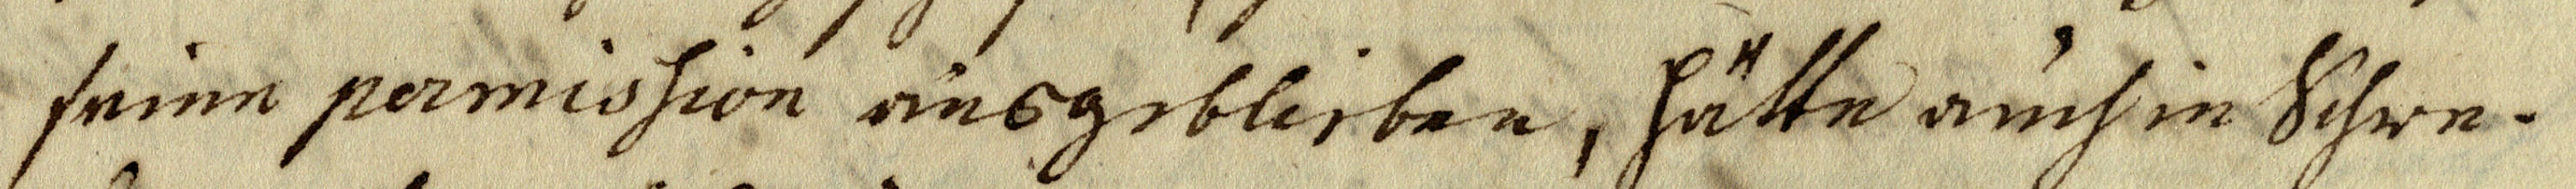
seine permission ausgeblieben, hätte auch in Schwe¬
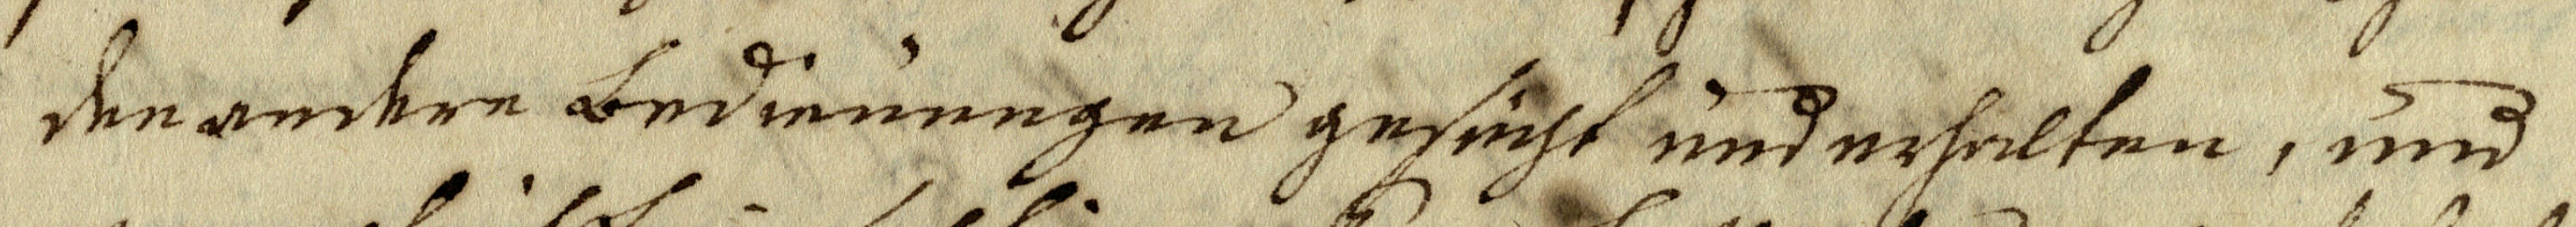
den andere Bedingungen gesucht und erhalten, und
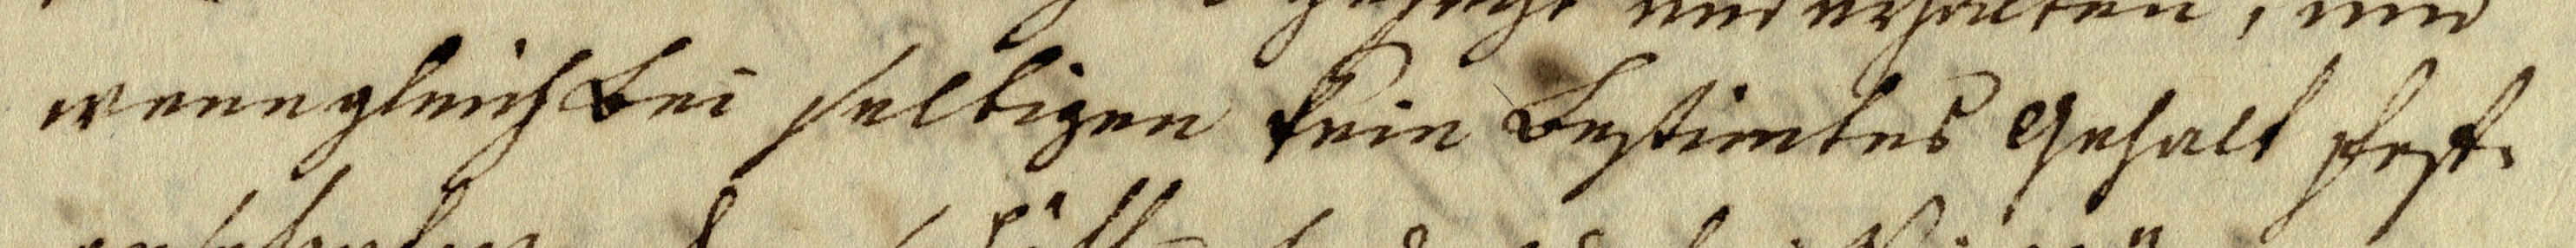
wenn gleich bei selbigen kein bestimtes Gehalt fest¬
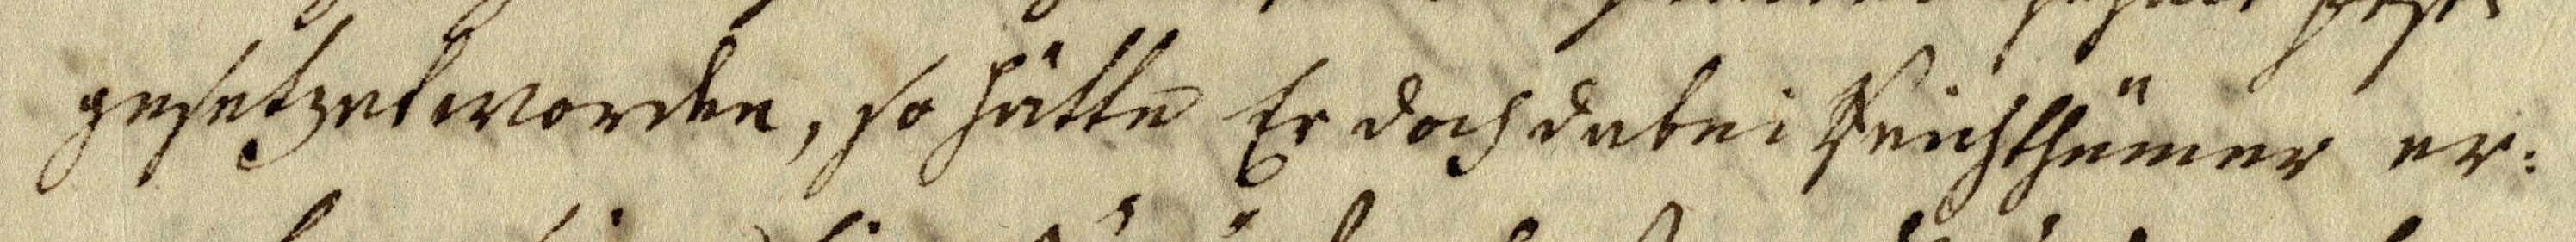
gesetzet worden, so hätte Er doch dabei Reichthümer er¬
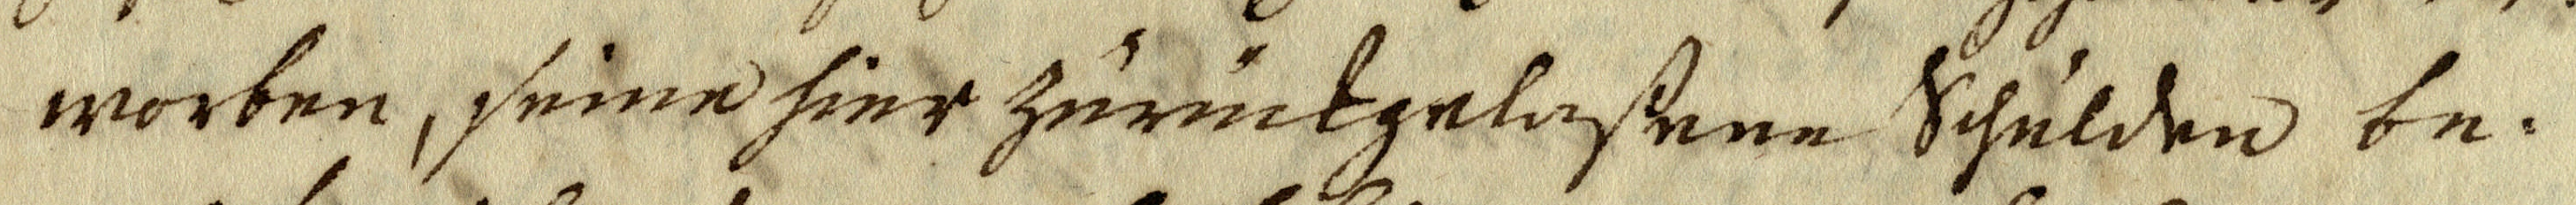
worben, seine hier zurückgelaßene Schulden be¬
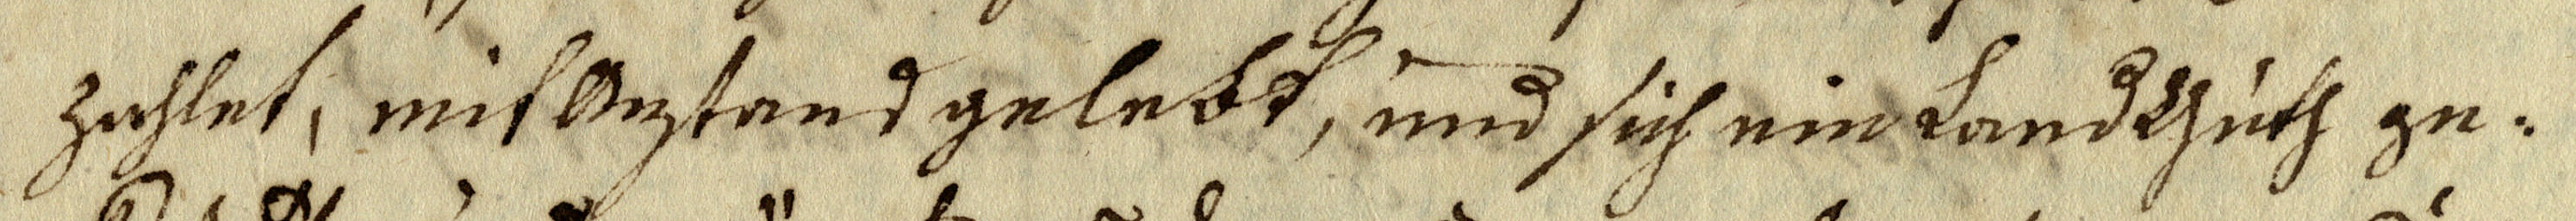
zahlet, mit Anstand gelebt, und sich ein Landguth ge¬
